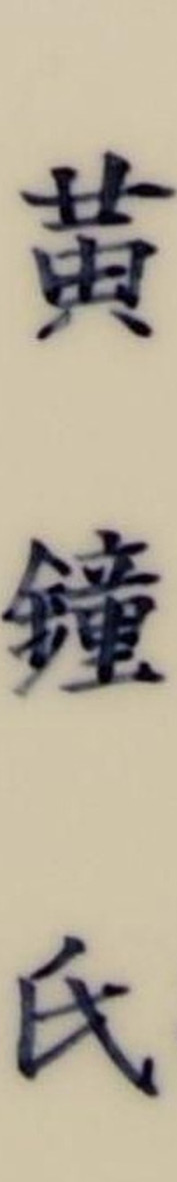黄鐘氏
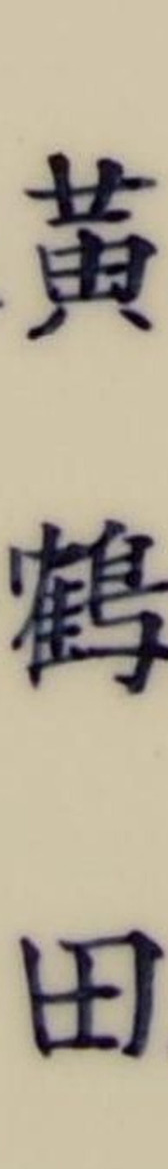黄鶴田
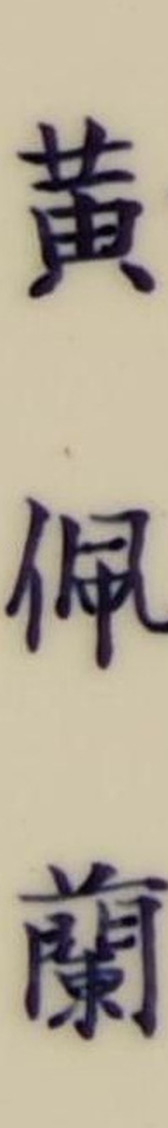黄佩蘭
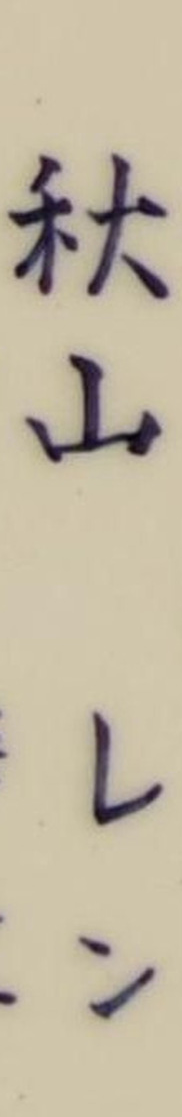秋山レン
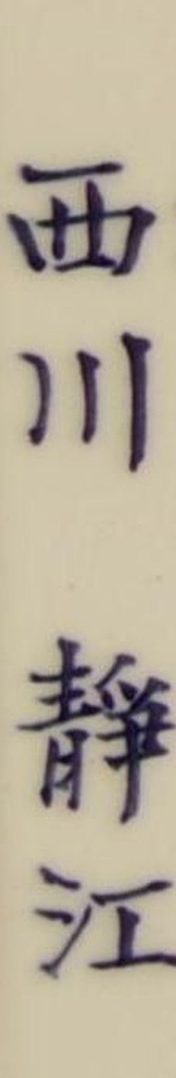西川静江

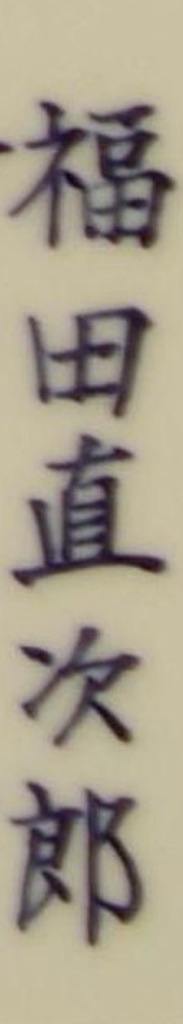福田直次郎
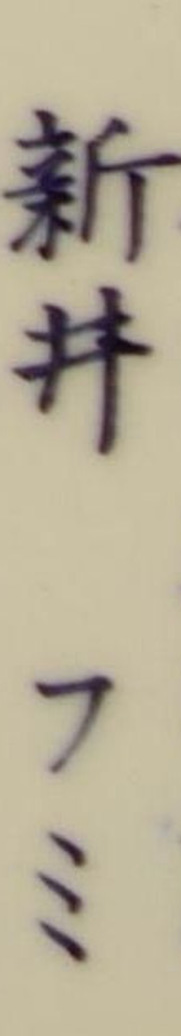新井フミ
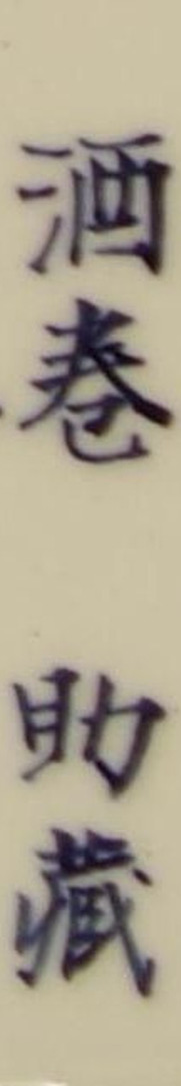酒巻助蔵
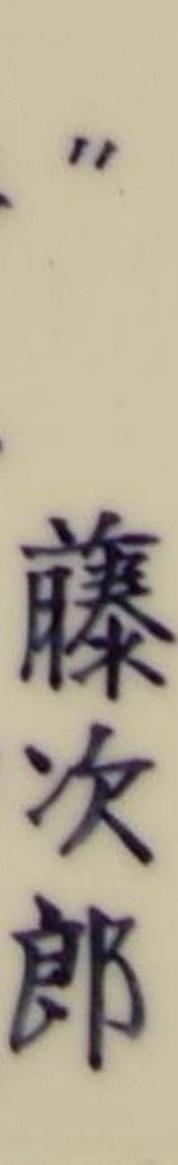藤次郎
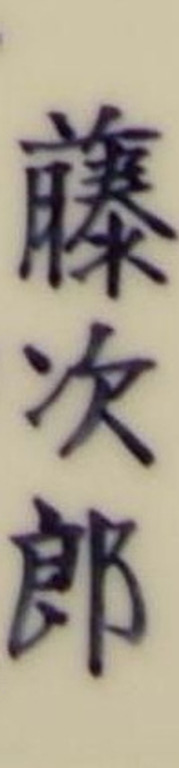藤次郎
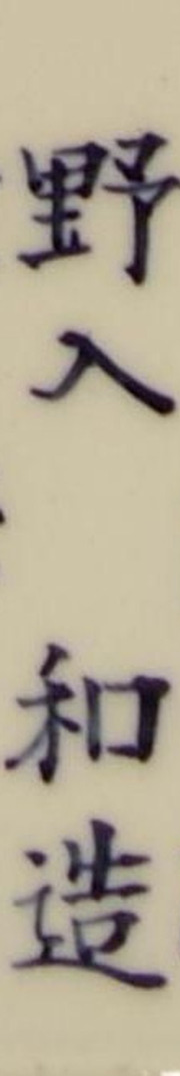野入和造
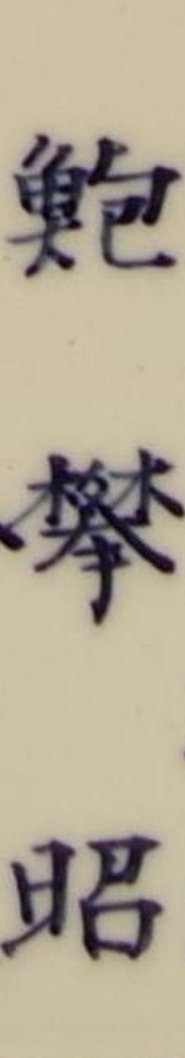鮑攀昭
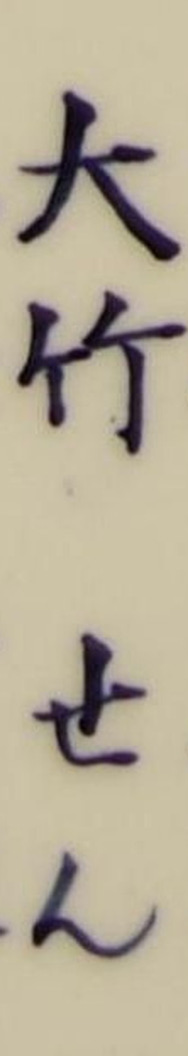大竹せん
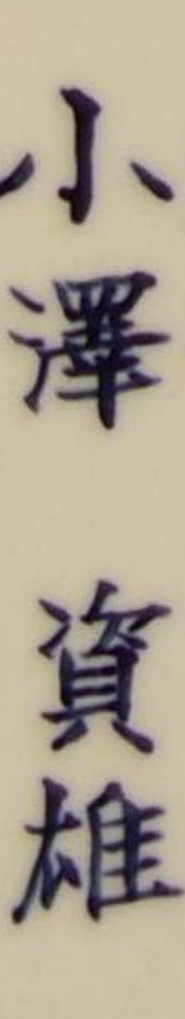小澤資雄
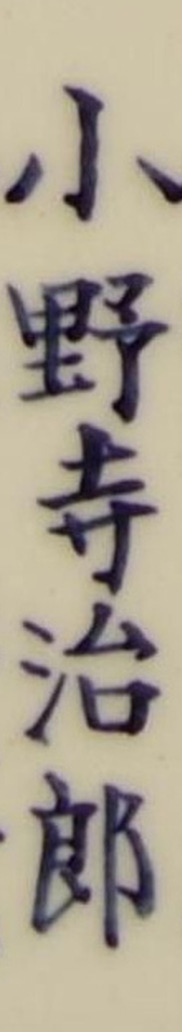小野寺治郎
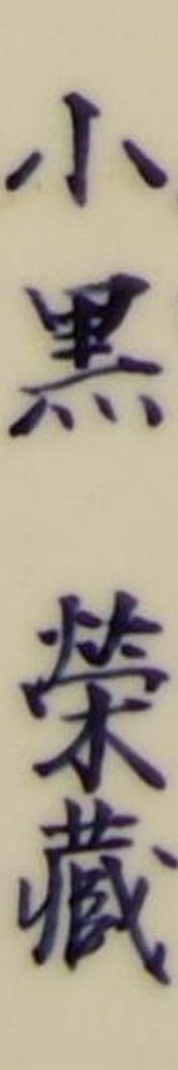小黒榮蔵
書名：E~L
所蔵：高野山金剛峯寺
